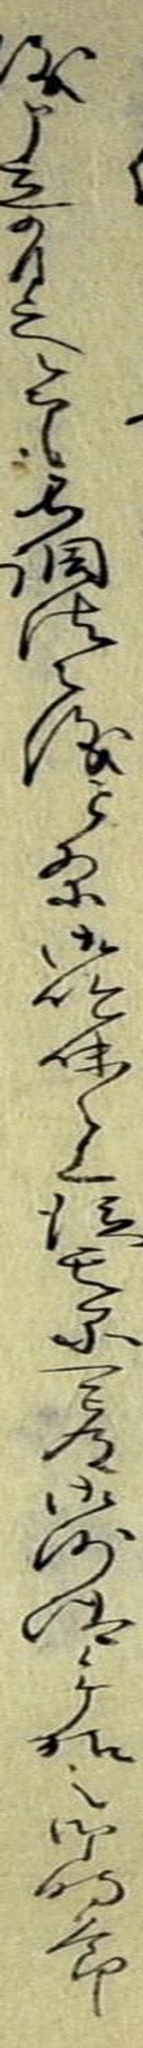儀申立有之候而も不調法之儀に候条御吟味之上従其品可被及御沙汰候ケ様之御時節
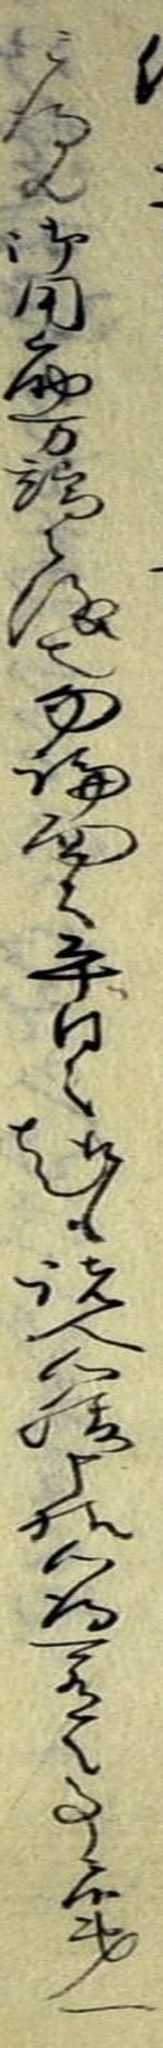に候得共御用筋万端之儀は勿論面々平日之趣も諸人心腹申様心得可有之事に候第一
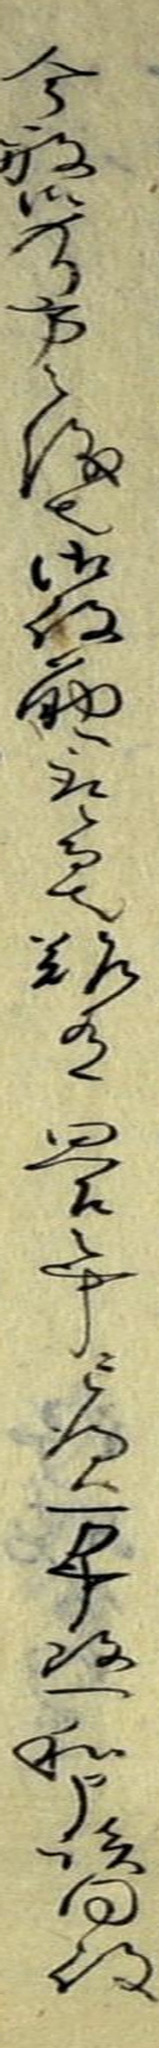今般御〆り方之儀は御役筋へ取候而は難有思召之事に候得は万事致一和申談同役
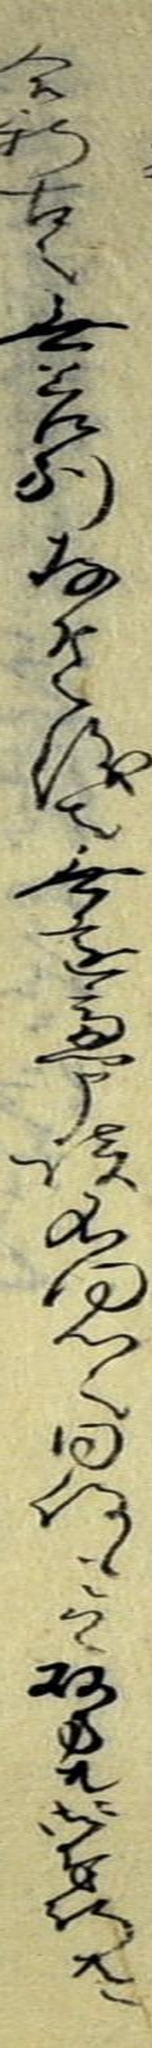合新古之無差別存付之儀は無遠慮申談不同心之同役も候はゝ双方共に御奉行共へ
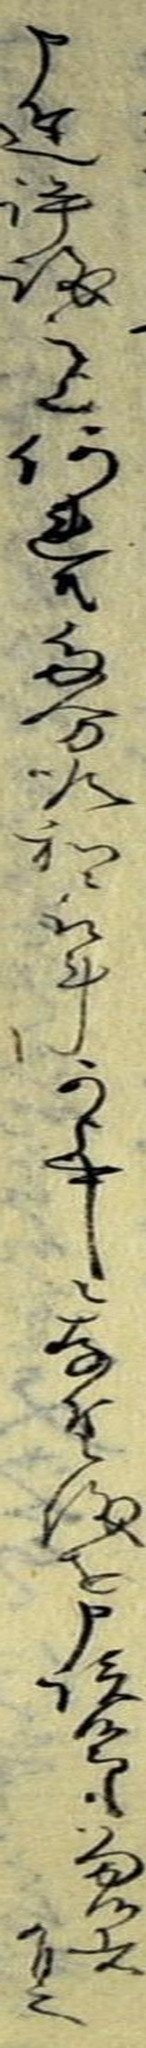申達評議之上何れ共多分順和に取斗可申事に存付之儀を申談候而も留候者有之
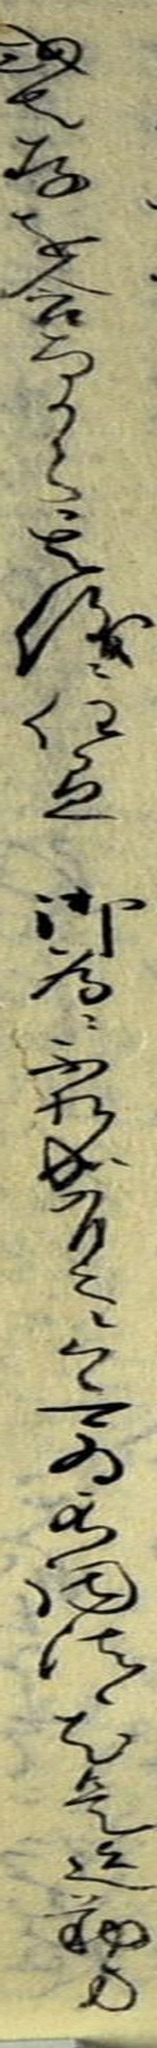或は存を含なから其儀に任宜御為に不相成有之候はゝ可為不調法候尤是迄勤方

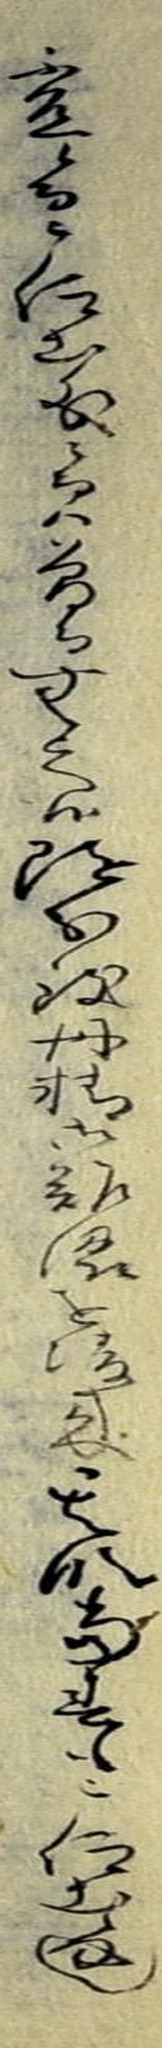不宜候而被仰出義に而は曽而無之候随分致丹精御難渋を凌来其段当春も被仰出通
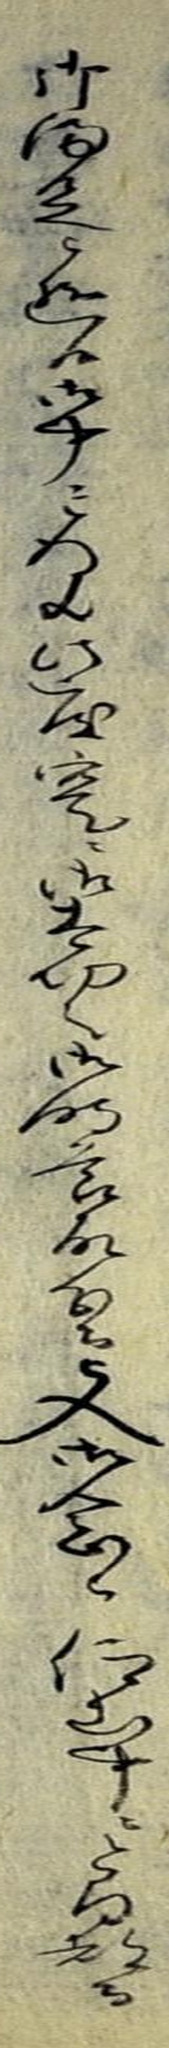御満足被遊候御事に候得共此度寔に御太切之御時節故至而被入御念被仰出事に候間都而
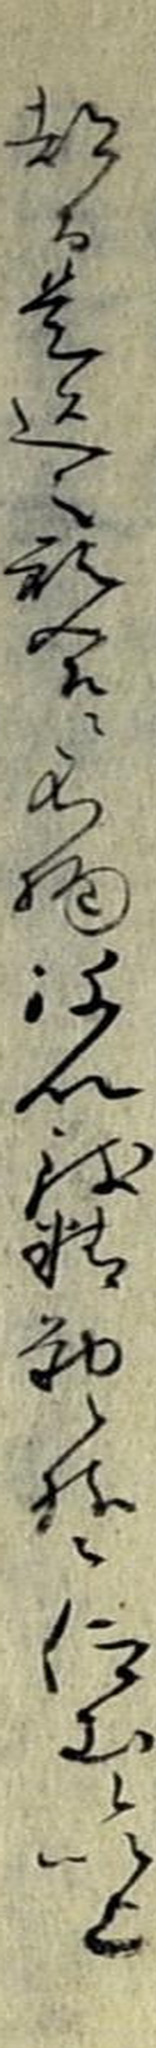都而是迄之形合に不拘弥以致精勤候様被仰出候以上
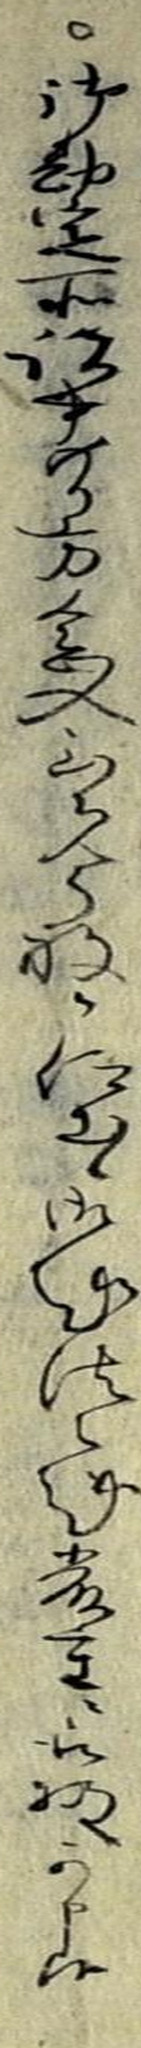〇御勘定所諸事〆り方念入至而今般被仰出候御趣法之趣厳重に被取扱可申候
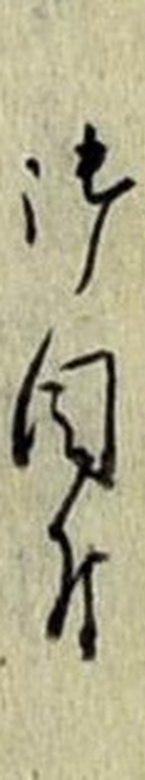御目付
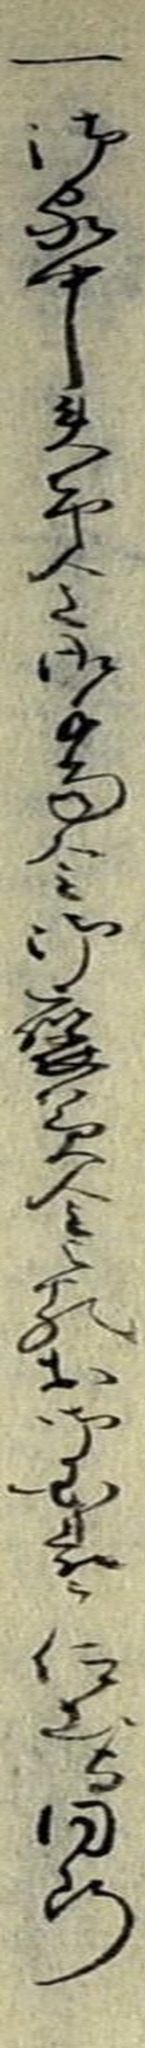一御家中失却金御手当金御褒美金之類於御国表被仰出与同断
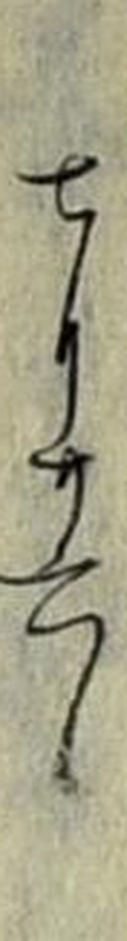七月廿六日
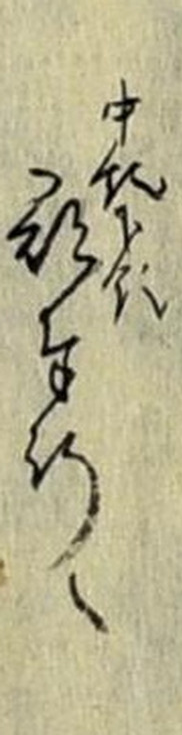郡奉行へ
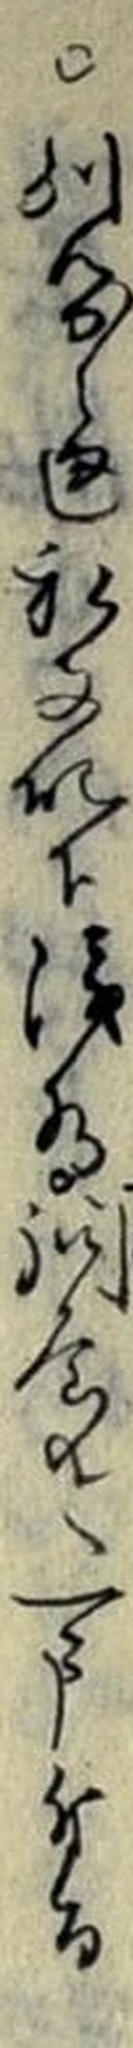〇別紙之通私支配下浅水◦問屋共へ可申付旨
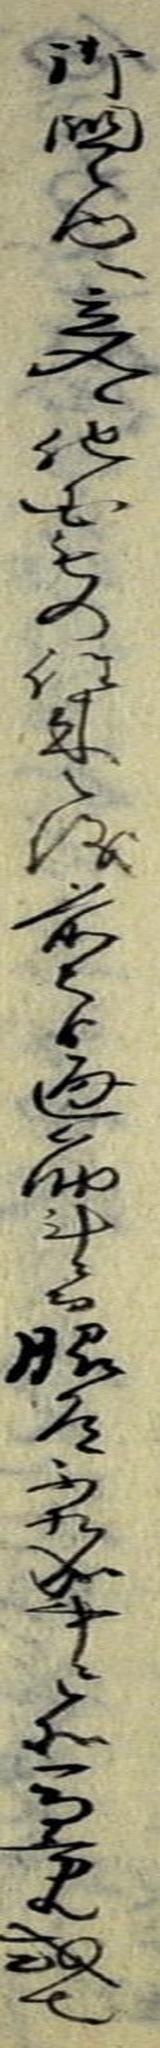御国之内へ立入候他国もの往来之儀前々ゟ通筋斗に而脇道不相成事に候処馬方共或は
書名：命令之部 二
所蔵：福井県文書館 Fukui Prefectural Archives
